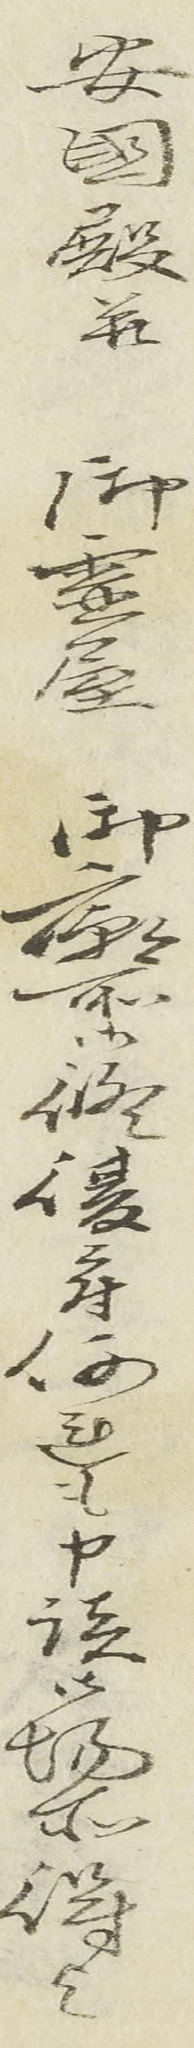安国殿幷御霊屋御廟所御修復ニ付何れも申談御場所得と
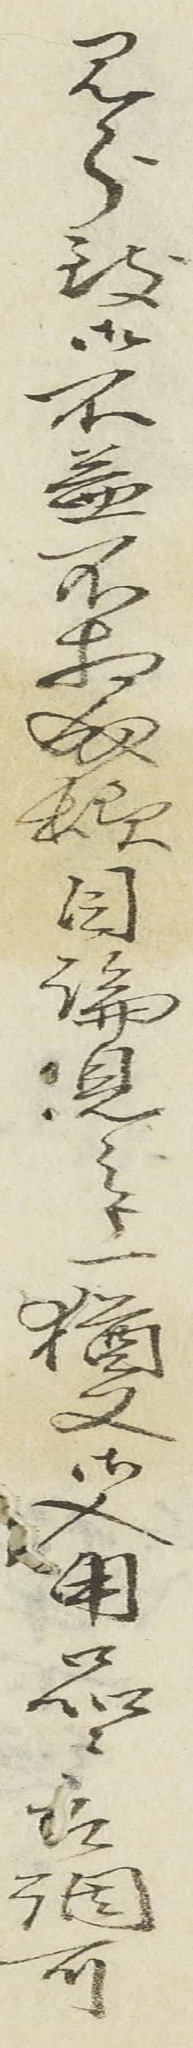見分致御不益不相成様目論見之上猶又御入用品々取調可
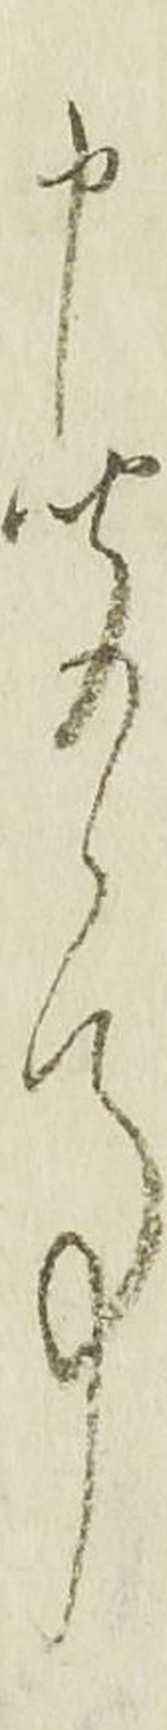申聞候事
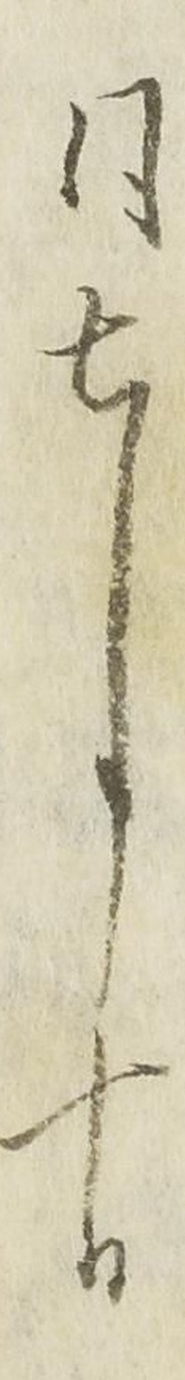同七月十日
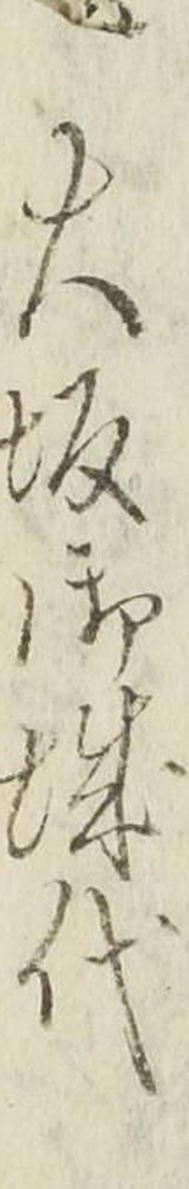大坂御城代
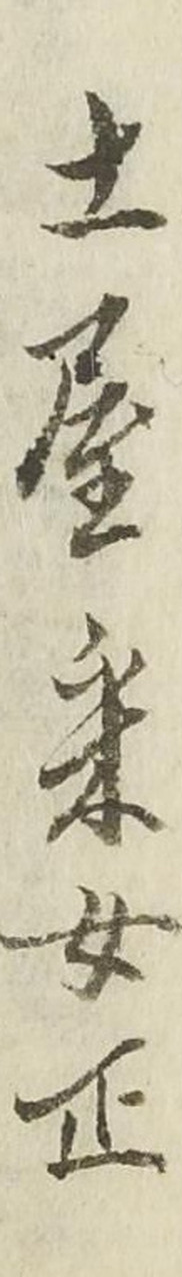土屋采女正
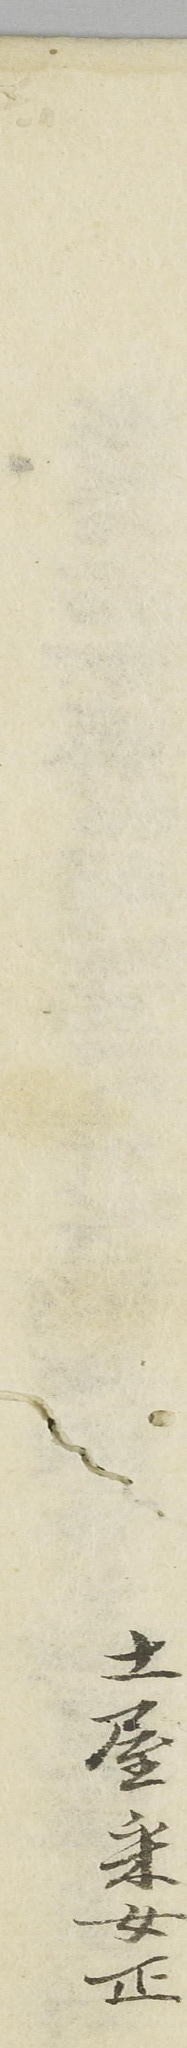土屋采女正

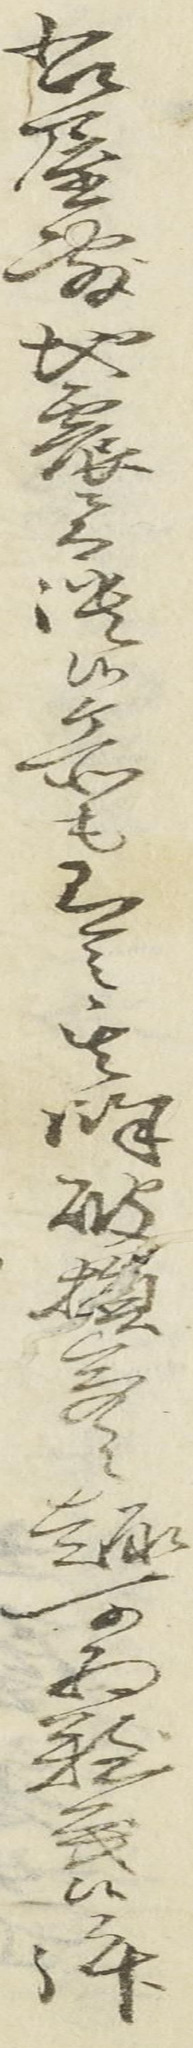右屋敷地震ニ而潰候ヶ所も有之其餘破損多之趣可為難義候拝
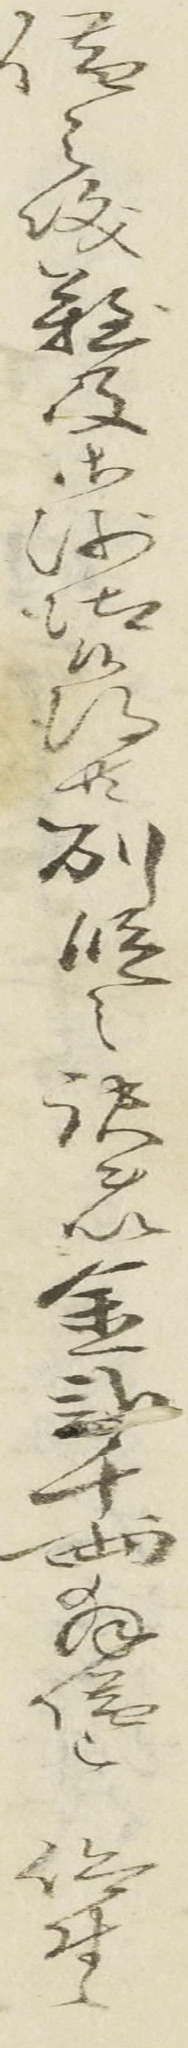借之義難及御沙汰候得共別段之訳ヲ以金弐千両拝借被仰付候
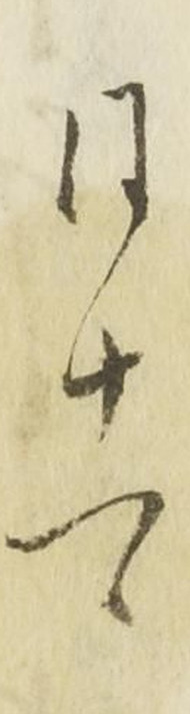同十一日
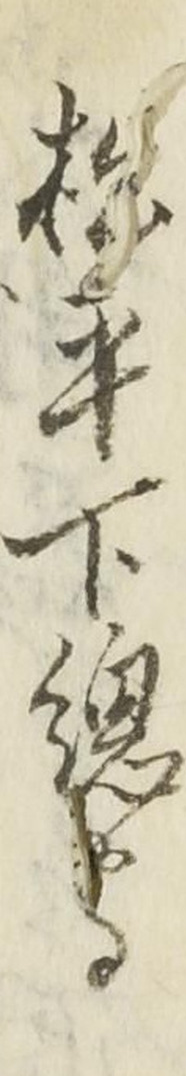松平下総守
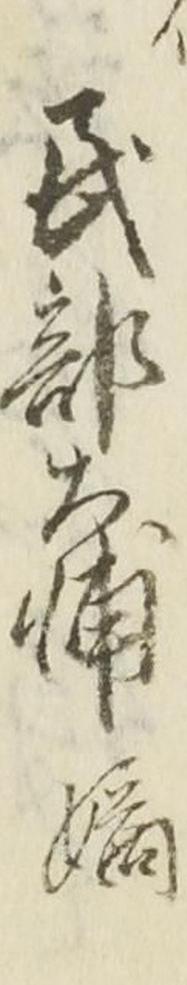民部大輔嫡
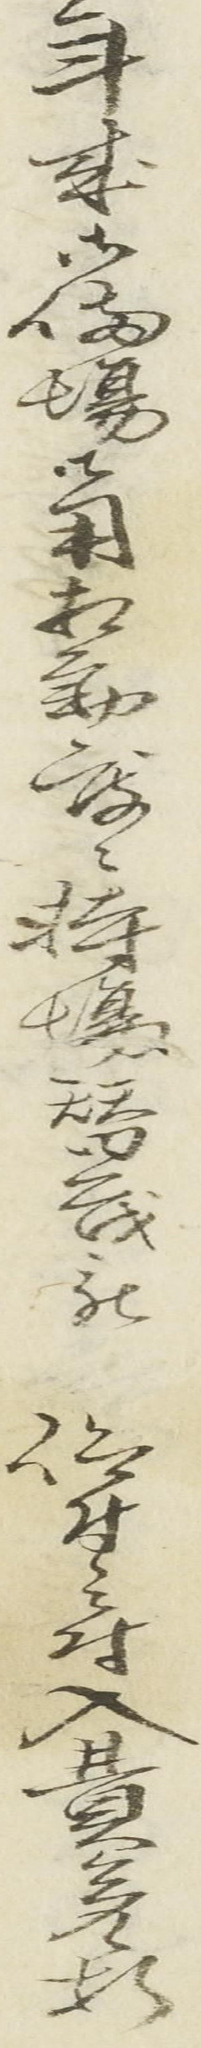年来御備場御用相勤度々持場替茂被仰付候ニ付入費多く折
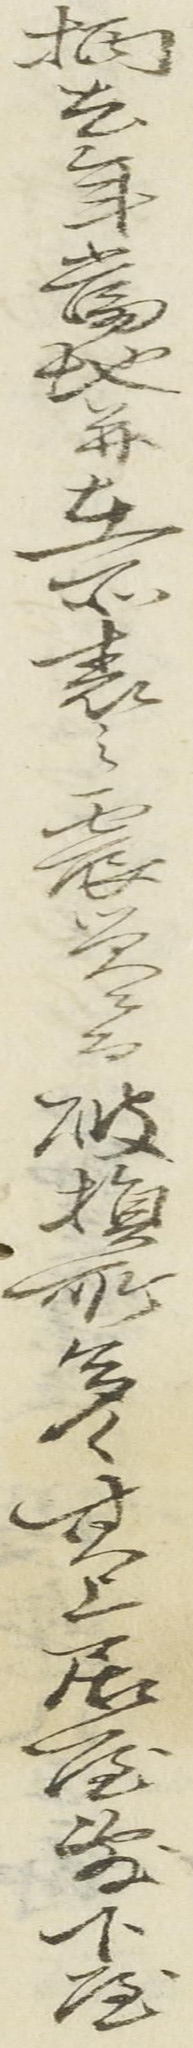柄去年当地幷在所表之震災ニ而破損所多く其上居屋敷下屋
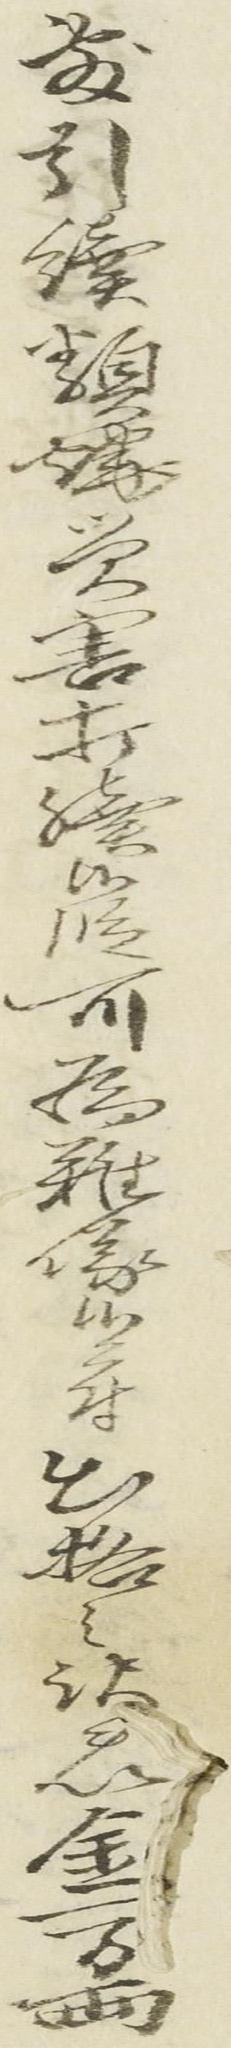敷引続類焼災害打続候段可為難儀候ニ付出格之訳ヲ以金一万両
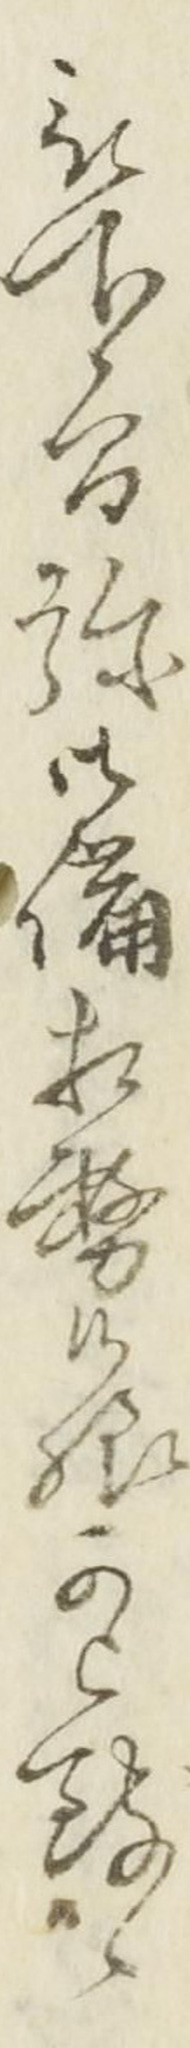被下候間弥御備相務候様可被致候
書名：安政二乙卯年十月二日大地震之事
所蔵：東京大学地震研究所図書室 Earthquake Research Institute Library, The University of Tokyo, JAPAN
